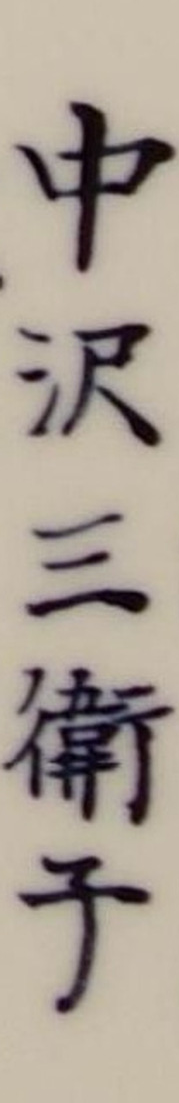中沢三衛子
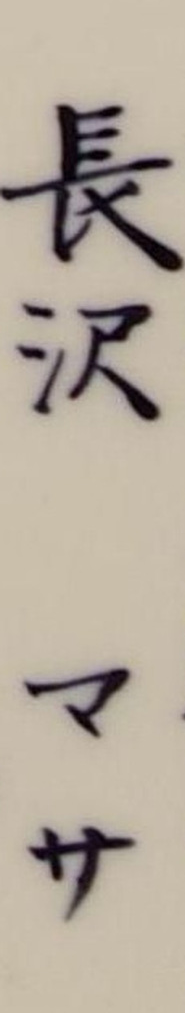長沢マサ
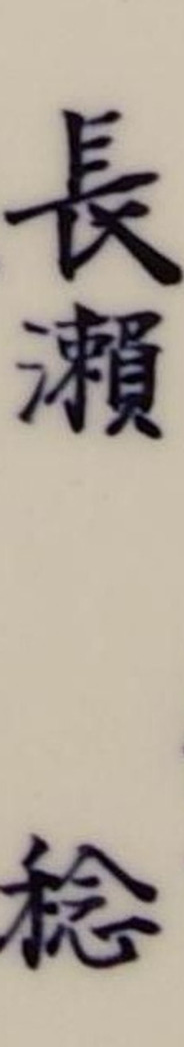長瀬稔
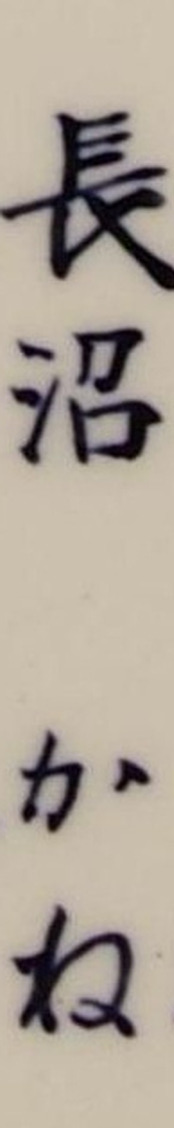長沼かね
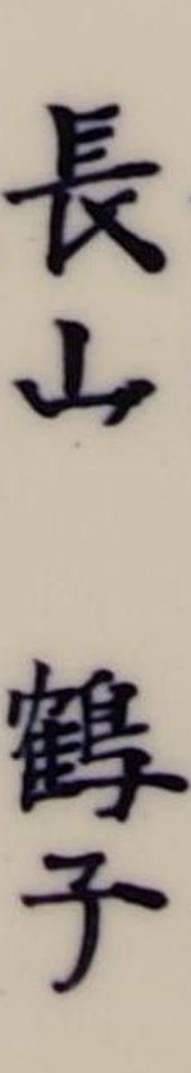長山鶴子
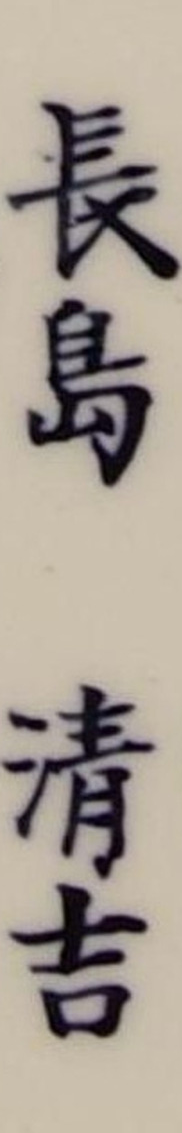長島清吉
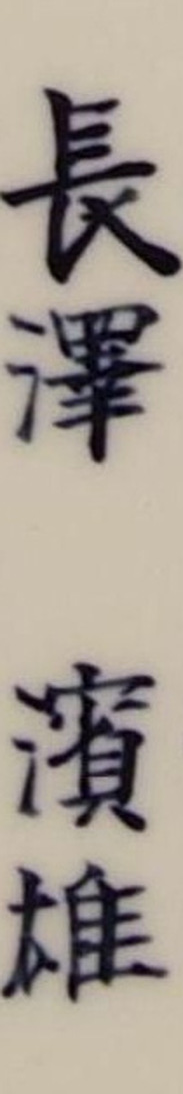長澤濱雄
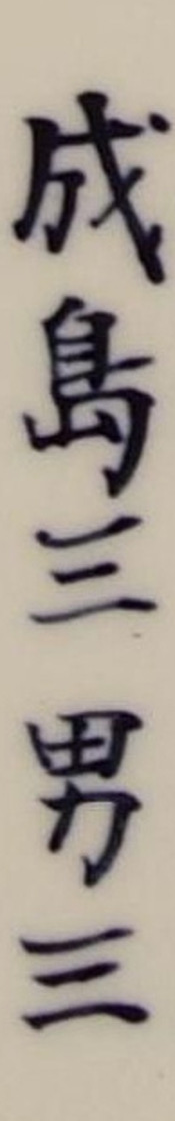成島三男三
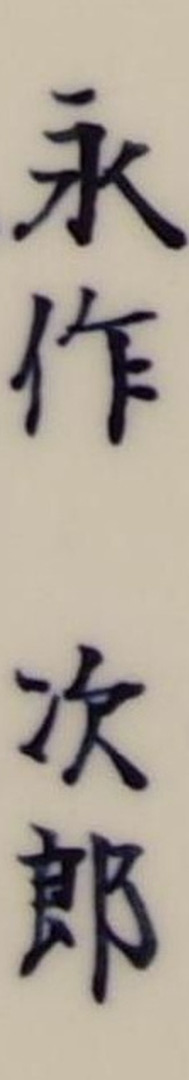永作次郎
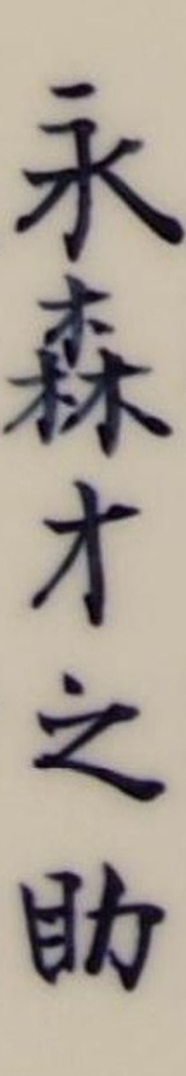永森才之助
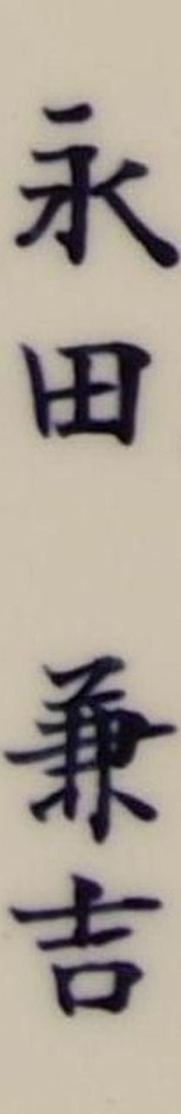永田兼吉
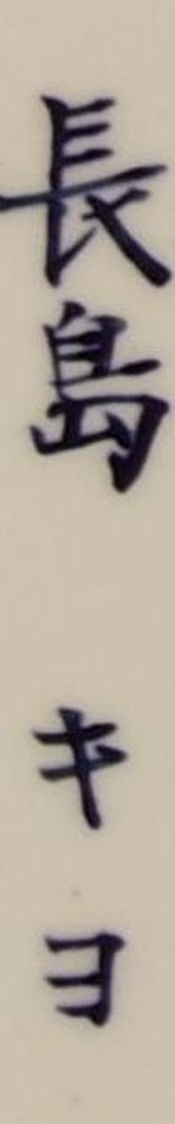長島キヨ
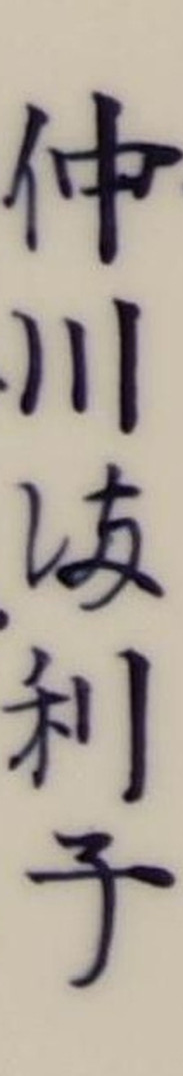仲川満利子
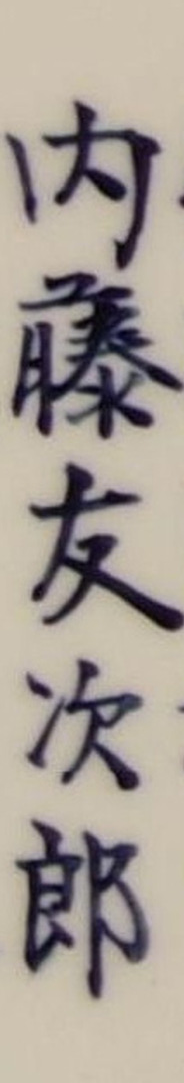内藤友次郎
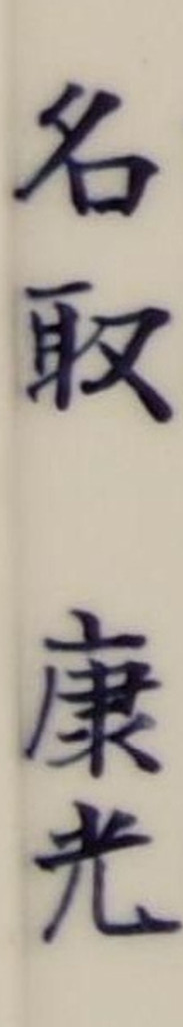名取康光

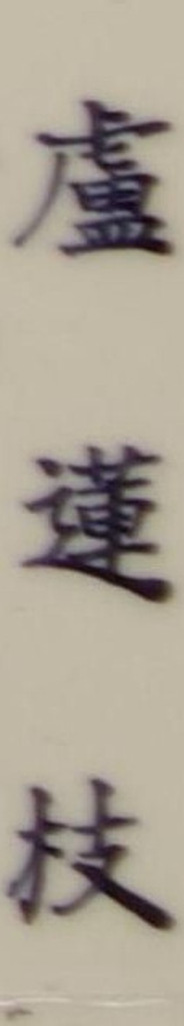盧蓮枝
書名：M~S
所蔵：高野山金剛峯寺
